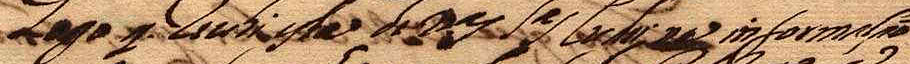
Logo q. Recebi esta de V.as Sas Cudei na informaçaõ
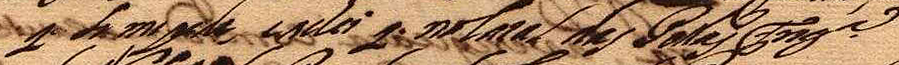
q. se me pede, e achei q. no Cazal das Palas Freg.a
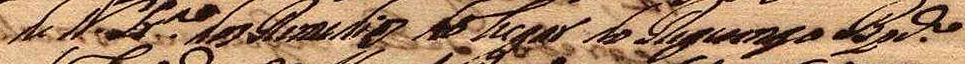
de N. Sr.a dos Remedios do Lugar do Reguengo Bpd.o
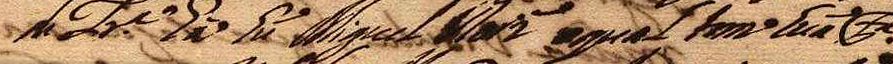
de Lx.a há hū Miguel Roiz̄ o qual tem huā F.a
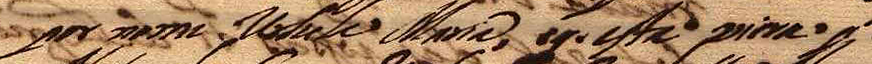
por nome Ursula Maria, e q. esta viera p.a
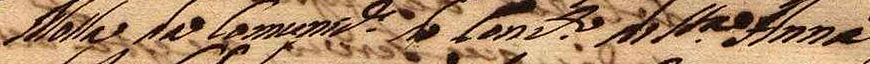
Mossa da Comunid.e do Conv.to de S.ta Anna
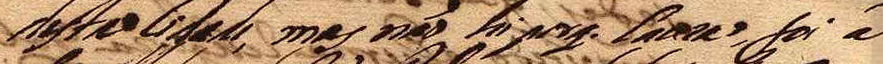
desta Cidade, mas naõ hi porq. Cauza, foi a
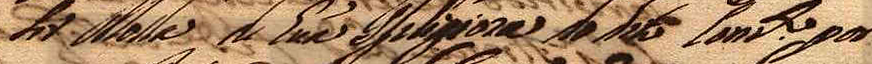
ser Mossa de huā Religioza do dito Conv.to por
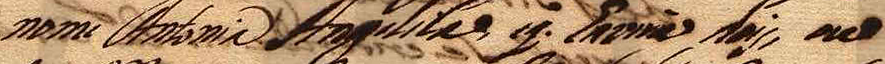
nome Antonia AngeliCa, e q. havia dois, ou
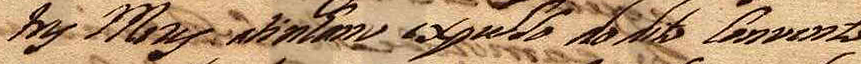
tres mezes a tinham expulso do dito Convento
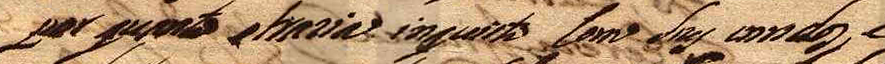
porquanto o trazia inquieto Com seus enredos, e
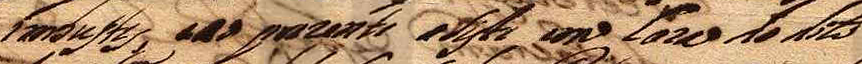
insultos, e ao prezente asiste em Caza do dito
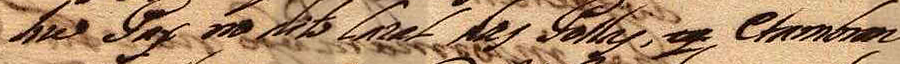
seu Pay no dito Cazal das Pollas, q e tambem
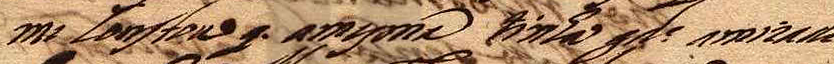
me Constou q. a mesma tinha gd.e amizade
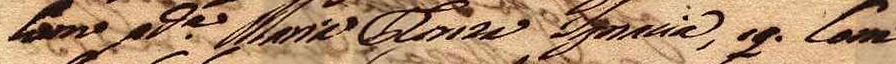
Com a d.a Maria Thereza Ignacia, e q. Com
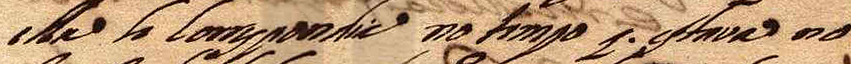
ella se Correspondia no tempo q. estava no
